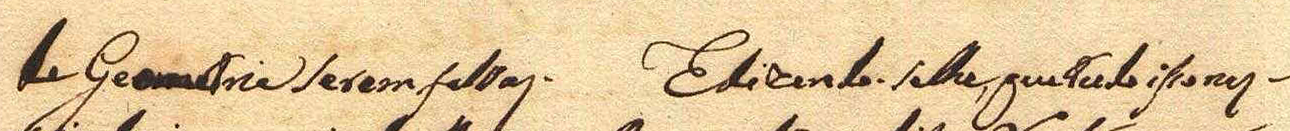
de Geometria serem falsas. E dizendo-selhe, que tudo isso nas
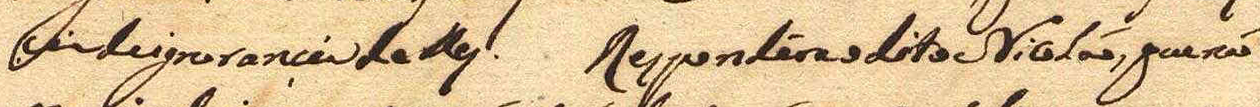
ceo de ignorancia delles. Respondéra o dito Nicoláo, que não
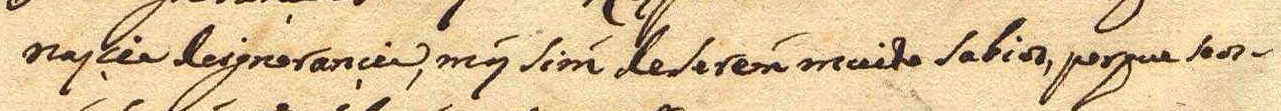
nascia de ignorancia, más sim de serem muito sabios, porque se os
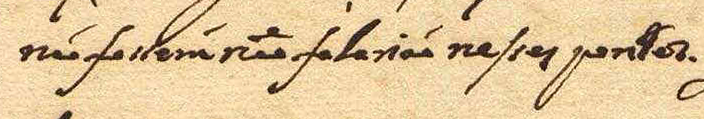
naõ fossem não falariaõ nesses pontos.
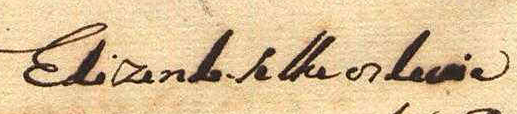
E dizendo-se lhe os devia
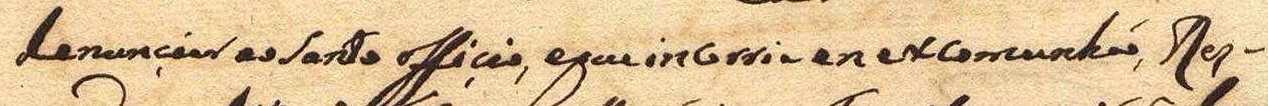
denunciar ao Santo officio, e que incorria en excomunhaõ, Res
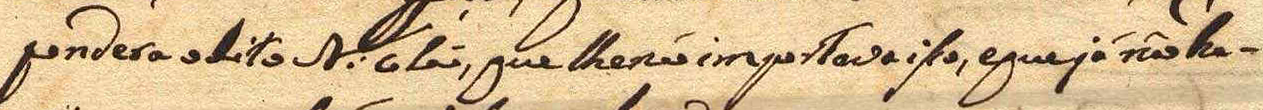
pondera o dito Nicoláo, que lhe naõ importava isso, e que já não ha
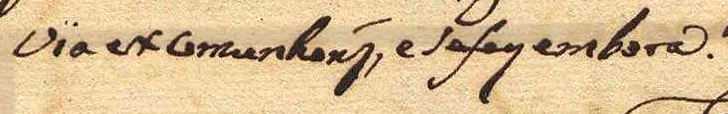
via excomunhon̄s, e se foy embora.
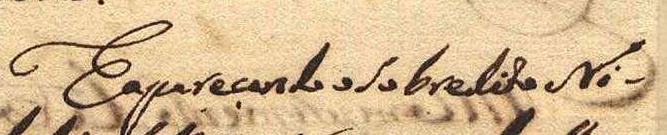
E aparecendo o sobredito Ni
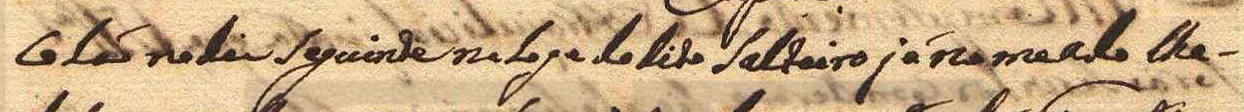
CoLáo no dia seguinte na Loge do dito Salteiro já nomeado lhe
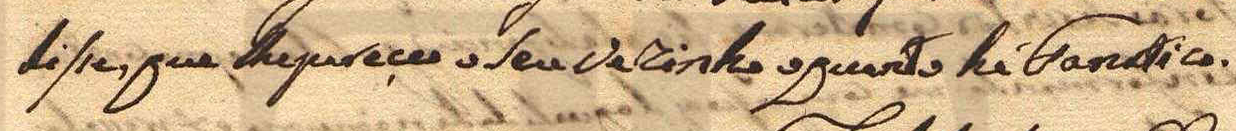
disse, que lhe pareçeo o seu vezinho o quanto hé Fanatico.
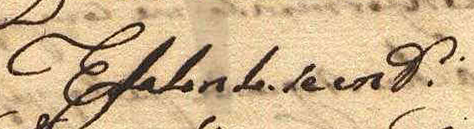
E falando-se en D.s
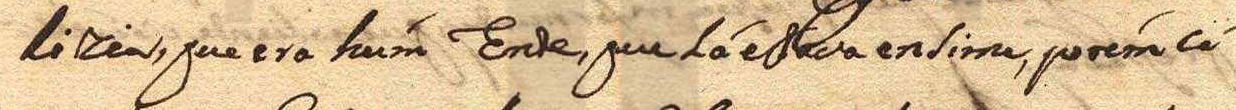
dizia, que era hum̄ Ente, que Lá estava ensima, porém cá
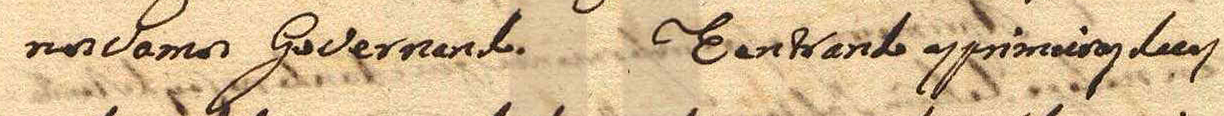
nos vamos Governando. E entrando as primeiras duas
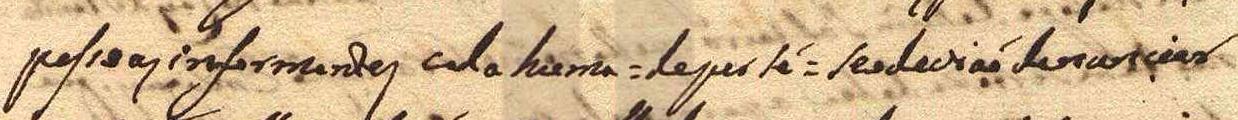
pessoas informantes cada huma = de per sé= se o deviaõ denunciar
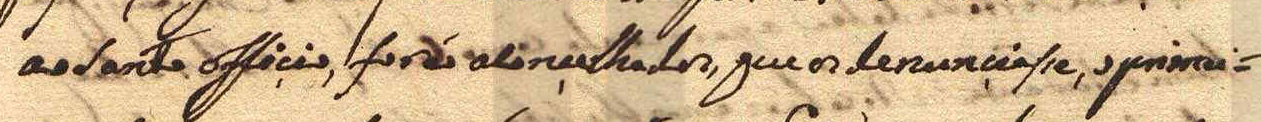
ao Santo officio, forão aconçelhados, que os denunciasse, o primei
